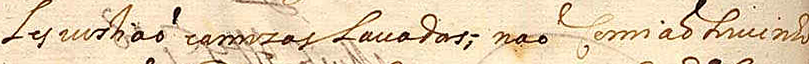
Les uestiaõ camizas Lauadas; naõ Comiaõ toucinho
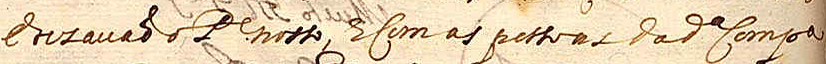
& rezauaõ o Pe nosso, E Com as pessoas da da Compa
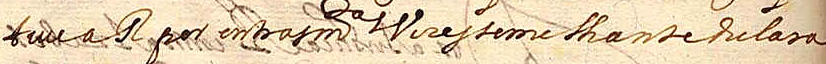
teue a R por outras mtas Vezes semelhante declara
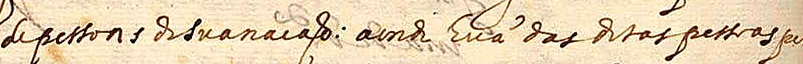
de pessoas de sua nacaõ: aonde huā das ditas pessoas per
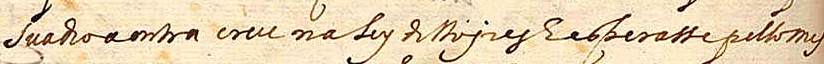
suadio a outra crece na Ley de Mojzes E esperasse pello mes
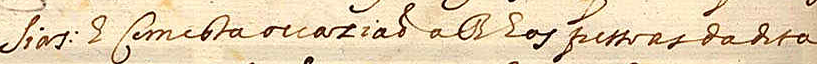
Sias: E Com esta occaziaõ a R E as pessoas da dita
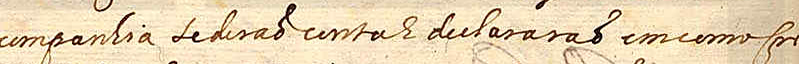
companhia se deraõ conta E declararaõ em como Cri
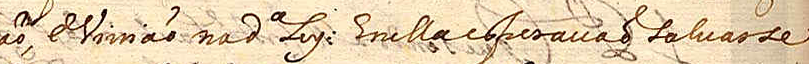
aõ, & Viuiaõ na da Ley: E nella esperauaõ saluarse
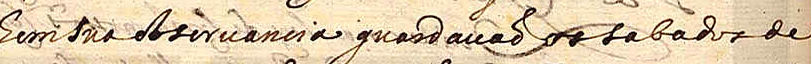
E em sua obseruancia guardauaõ os sabados de
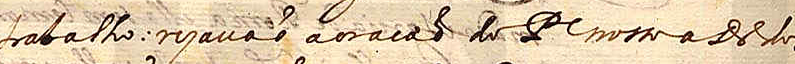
trabalho : rezauaõ a oracaõ do Pe nosso a Ds̄ dos
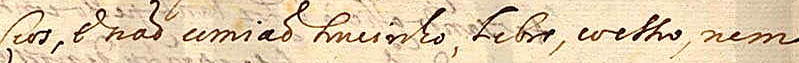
Ceos, & naõ comiaõ toucinho, Lebre, coelho, nem
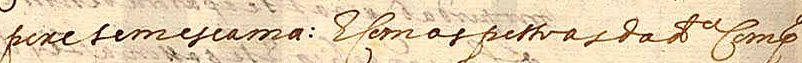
pexe sem escama: E Com as pessoas da d̄a Compa
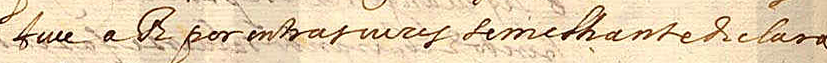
teue a R por outras uezes semelhante declara
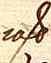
caõ
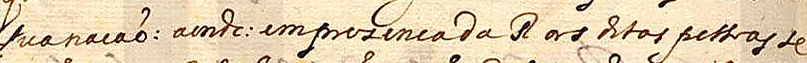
sua nacaõ : aonde: em prezenca da R as ditas pessoas se
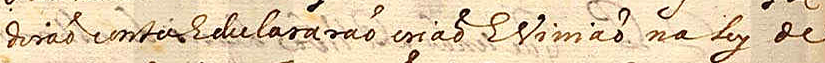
deraõ conta E declararaõ criaõ E Viuiaõ na Ley de
